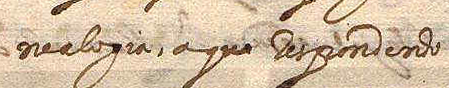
nealogia, a que Respondendo
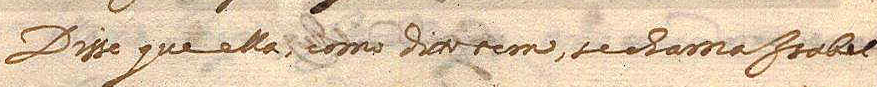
Disse que ella, como ditto tem, se chama Jsabel
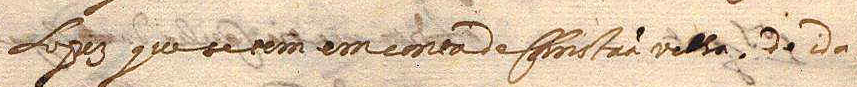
Lopez que se tem em conta de Christaā velha, de ida
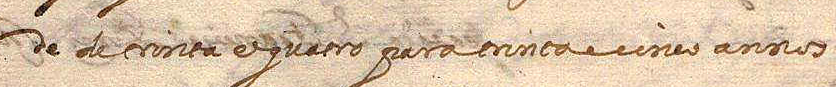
de de trinta e quatro para trinta e cinco annos
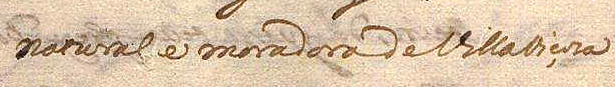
natural e moradora de Villa viçosa
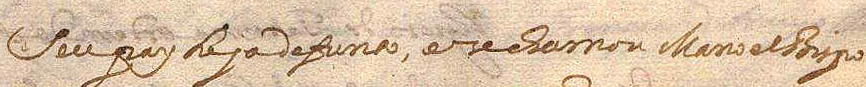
Seu pay he ja defunto, e se chamou Manoel Bispo
